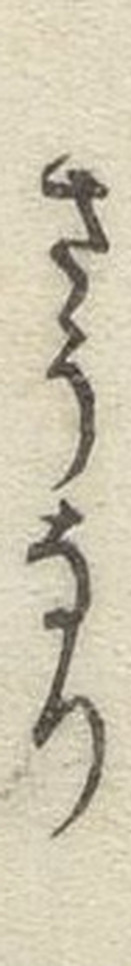さうなり
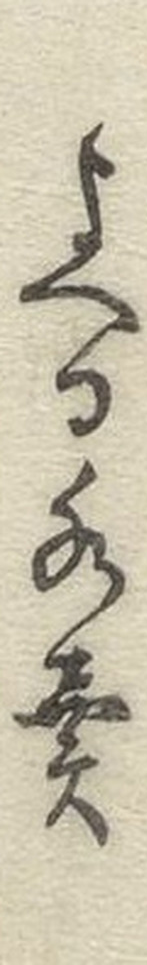よへる水売
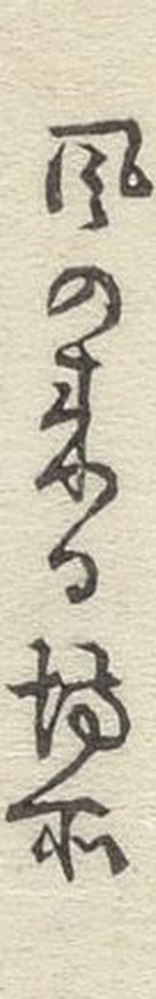風の来る場所
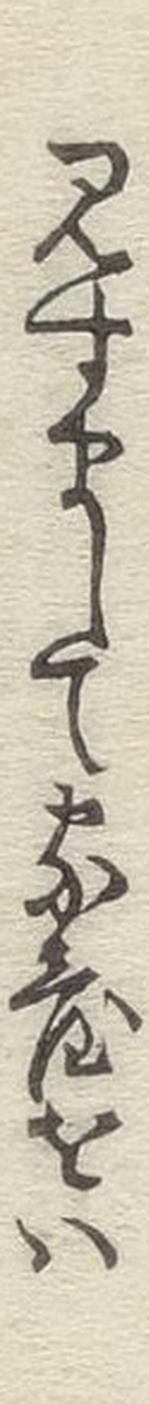見すまして家台をは
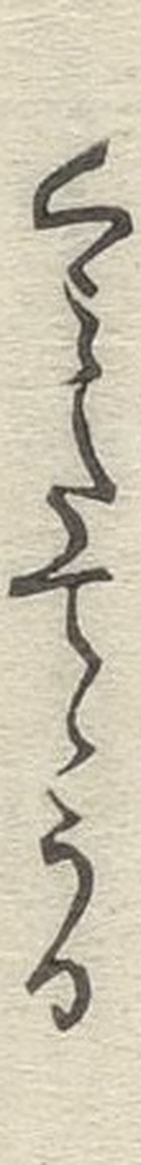くみたてゝてうる
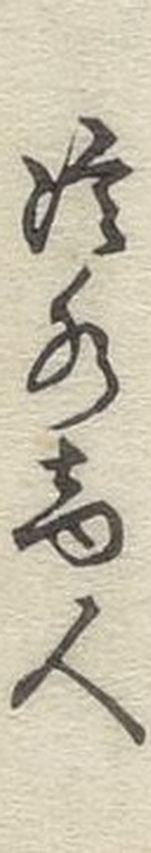冷水商人
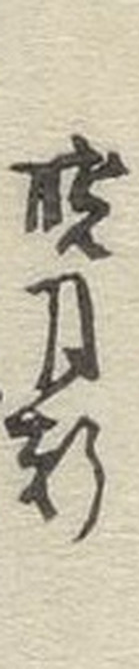暁月軒
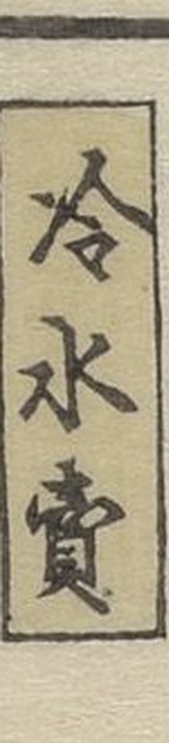冷水売

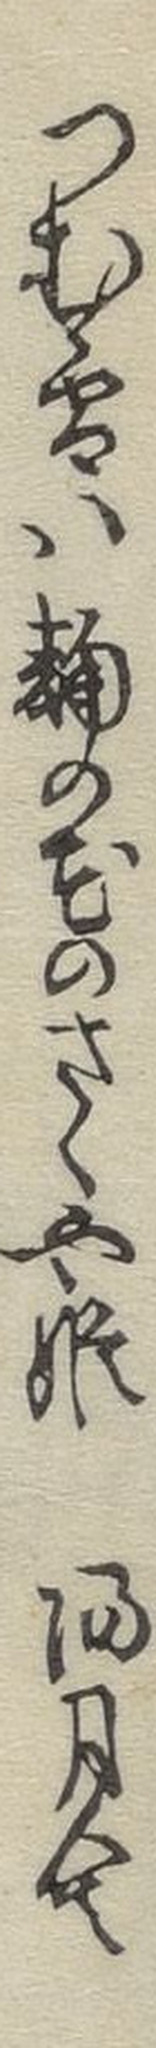つむ雪は麹の花のさくや姫陽月舎
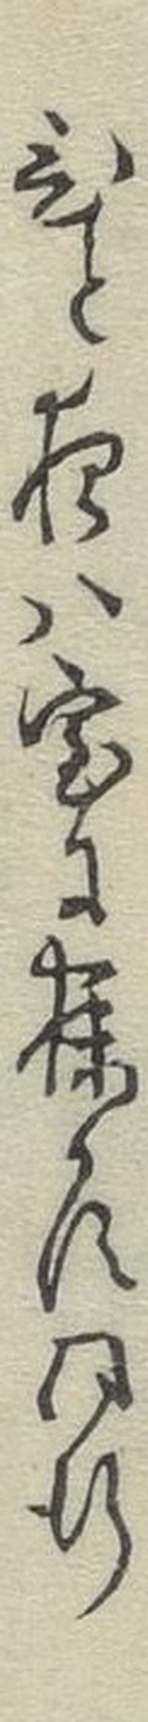ひと夜は宝に寝かす同行
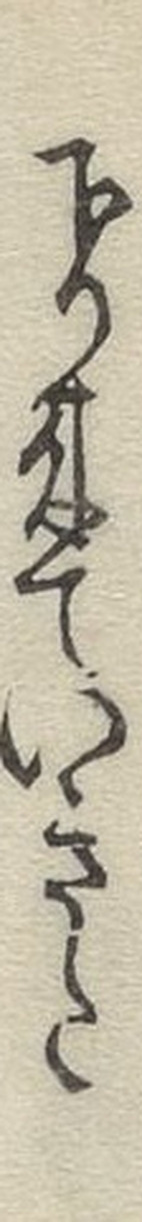下り来ていきた
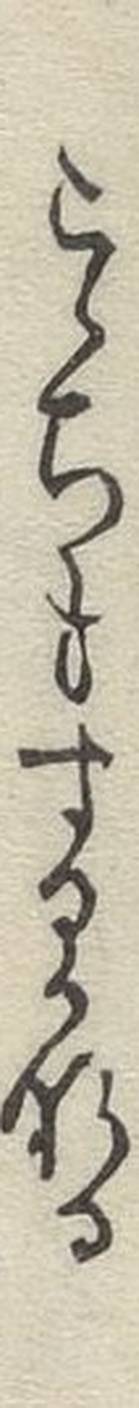こゝちもするかなる
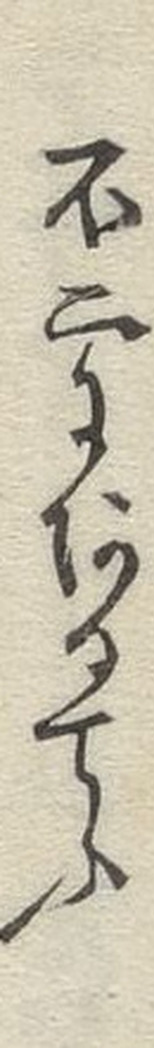不二にあるてふ
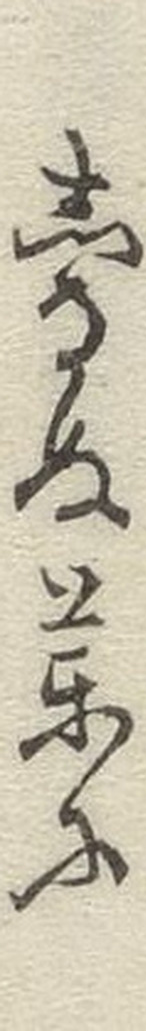しなぬ薬に
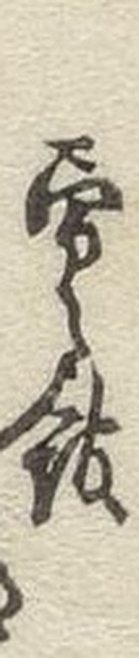勇々館
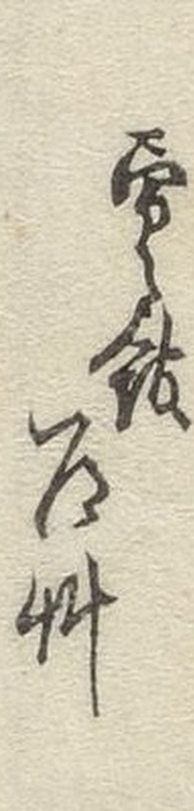勇々館
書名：Picture Album of People with Kyōka (Light Verse) (Kyōka shiki jinbutsu 狂歌四季人物)
